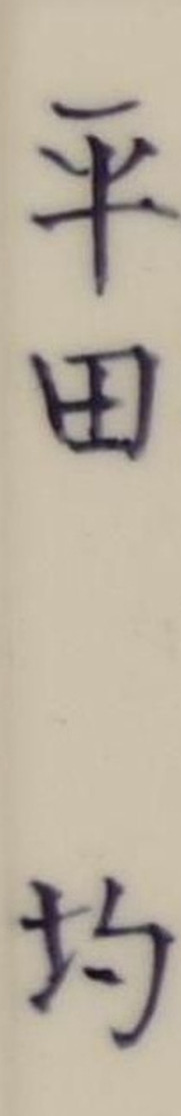平田均

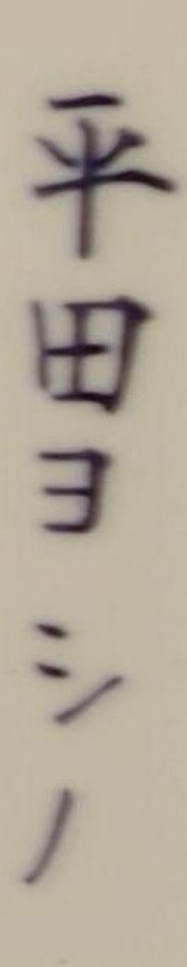平田ヨシノ
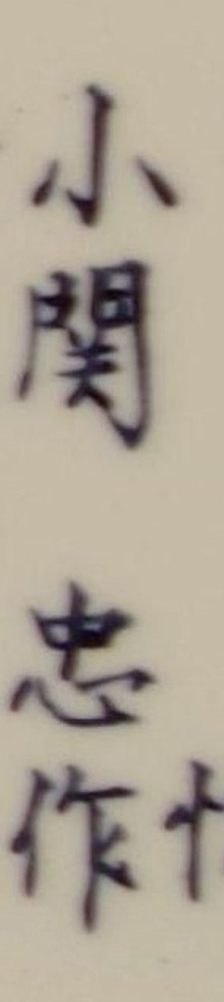小関忠作
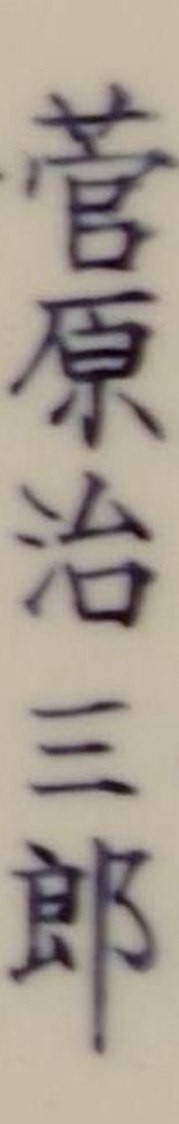菅原治三郎
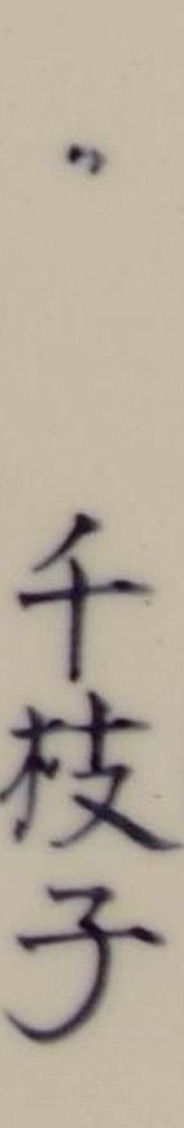千枝子
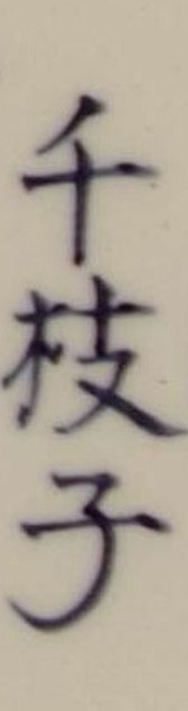千枝子
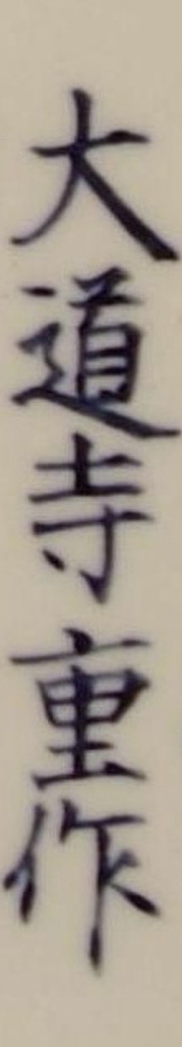大道寺重作
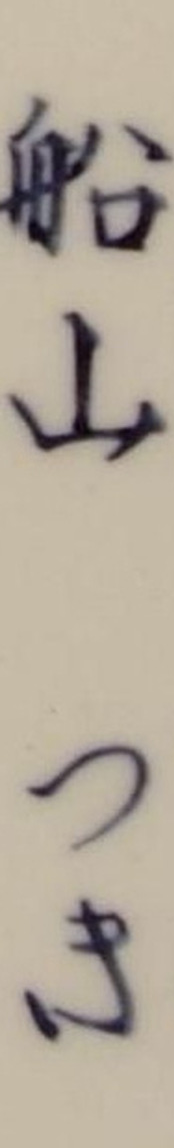船山つき
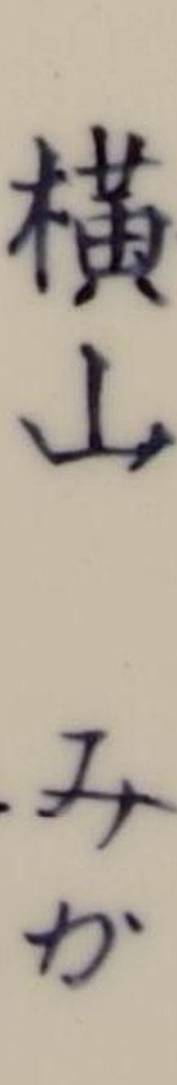横山みか
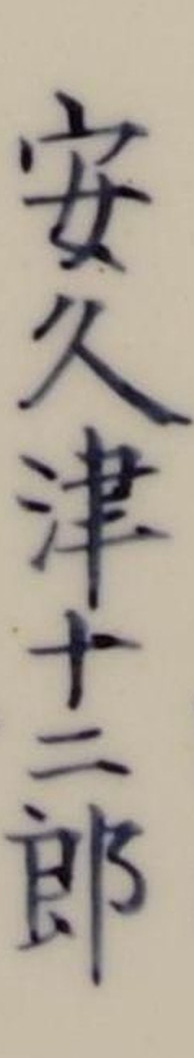安久津十二郎
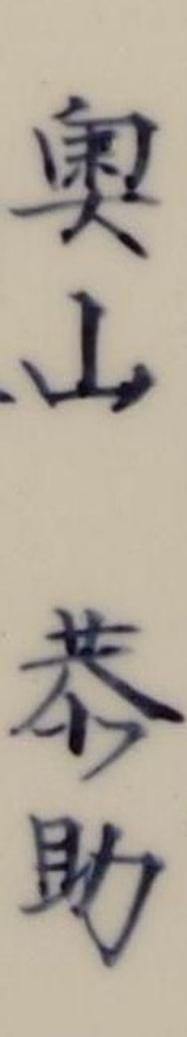奥山恭助
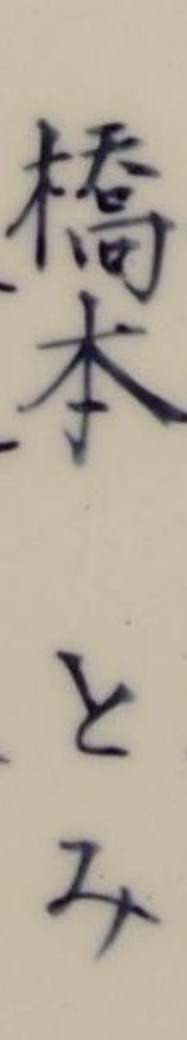橋本とみ
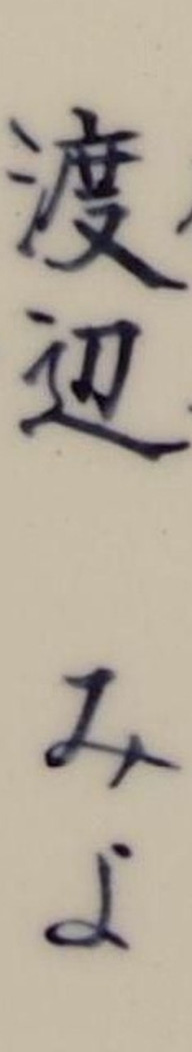渡辺みよ
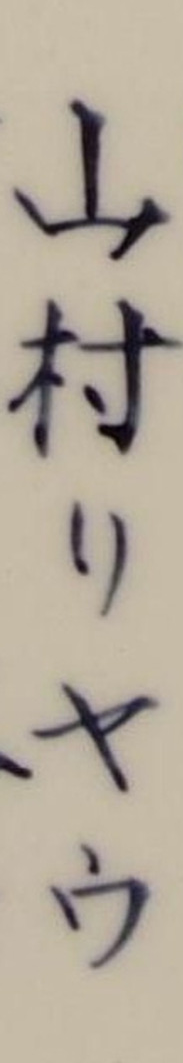山村リヤウ
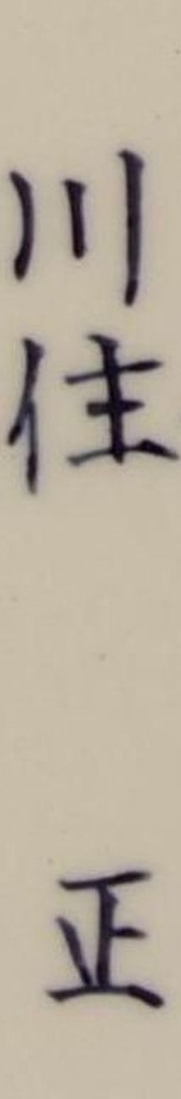川住正
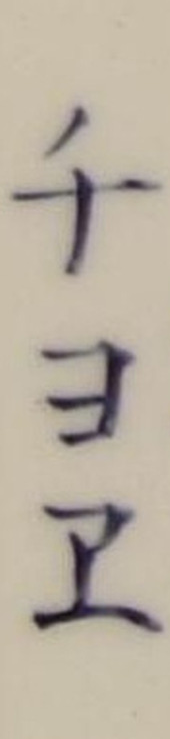チヨヱ
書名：M~S
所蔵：高野山金剛峯寺
